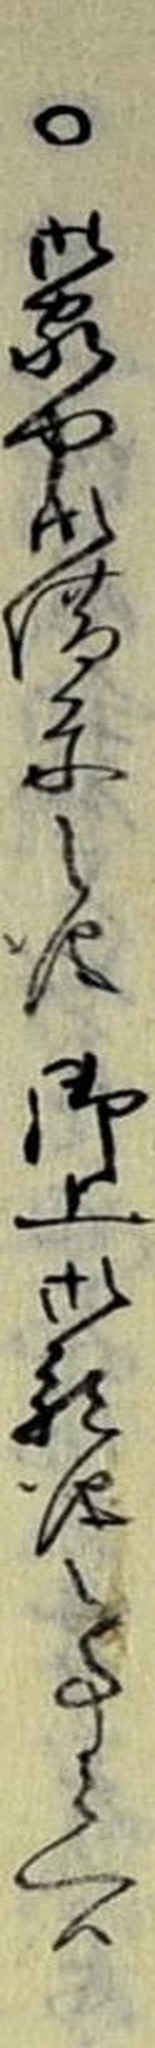〇御家中御借米之儀御上御難儀之事ニ候ヘハ
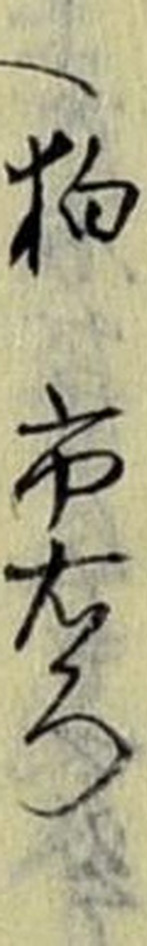狛市右衛門
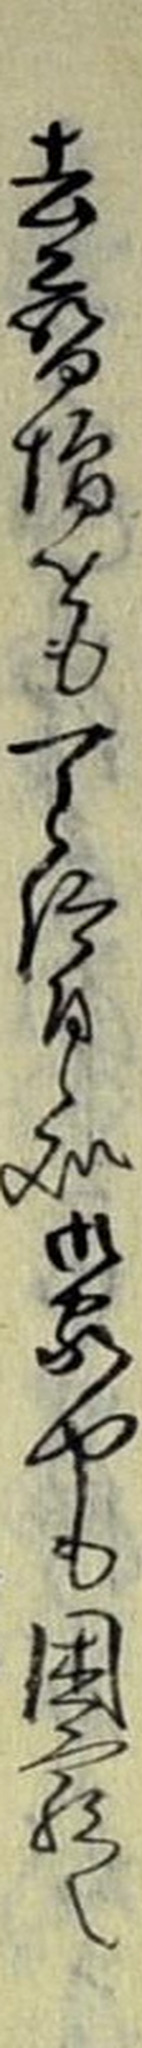去暮増をも可被仰付候処御家中も困窮之
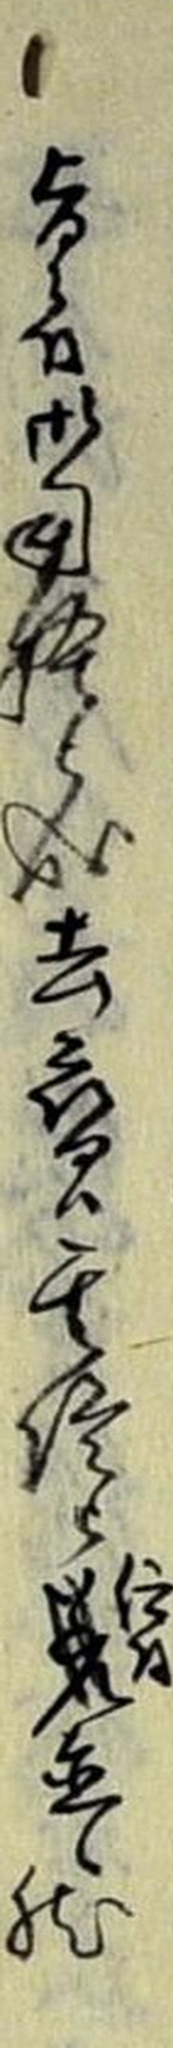旨ニ付御用捨被成去暮ハ其儘被仰付置候然
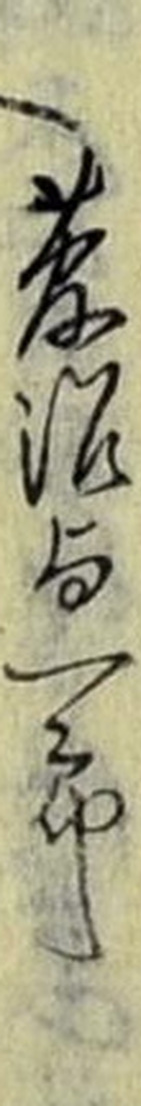菅沼与一郎
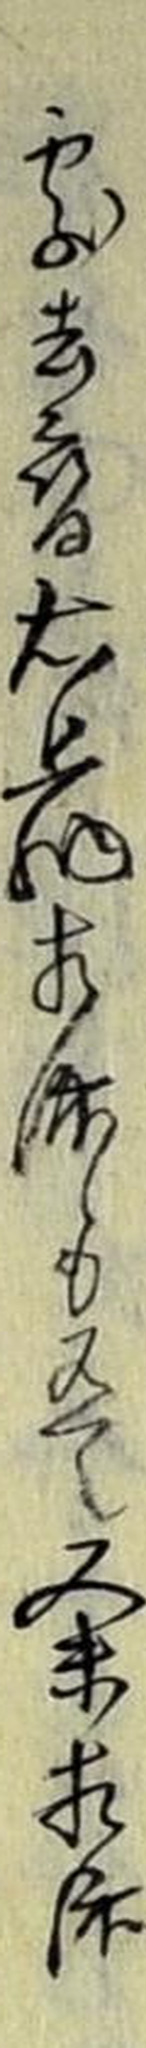処去暮右上納相済候も有之又未相済
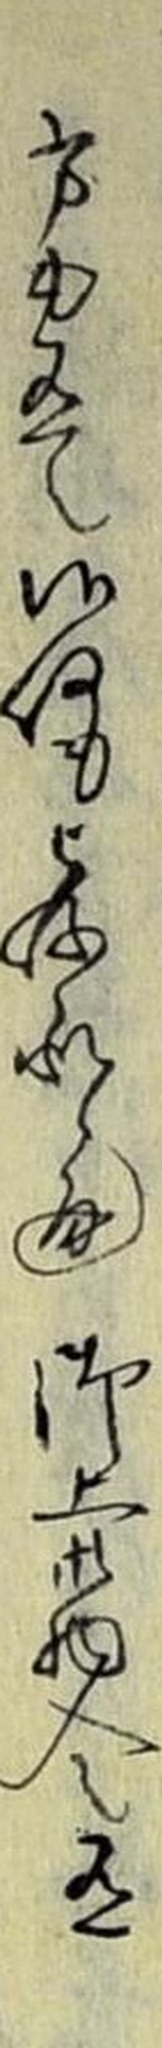方も有之候何も被及承候通御上御物入之有
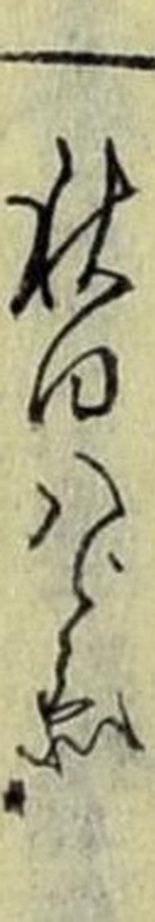秋田八郎兵衛
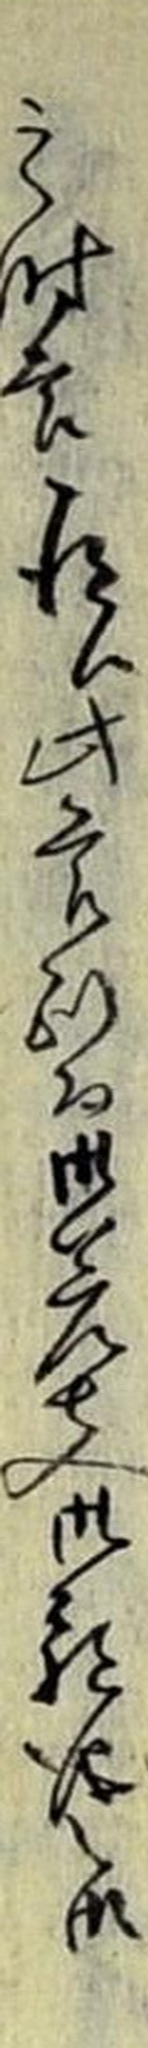之時節候得ハ此節別而御差支御難儀之御
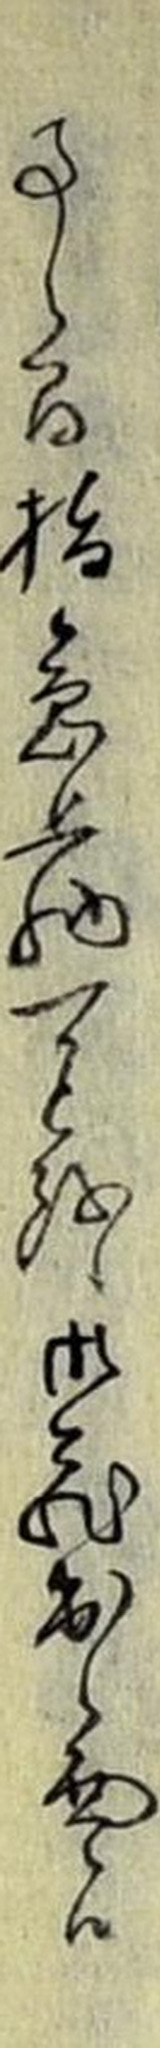事候間指急上納可被致候御蔵出候面々ハ
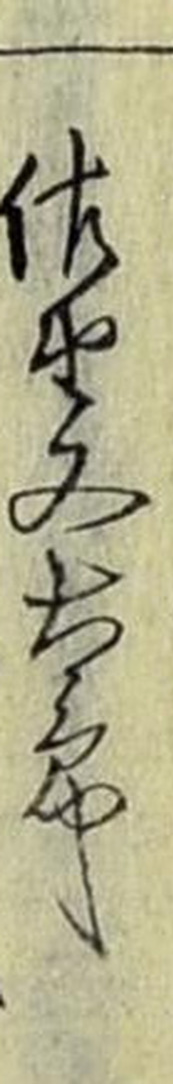佐野又太郎
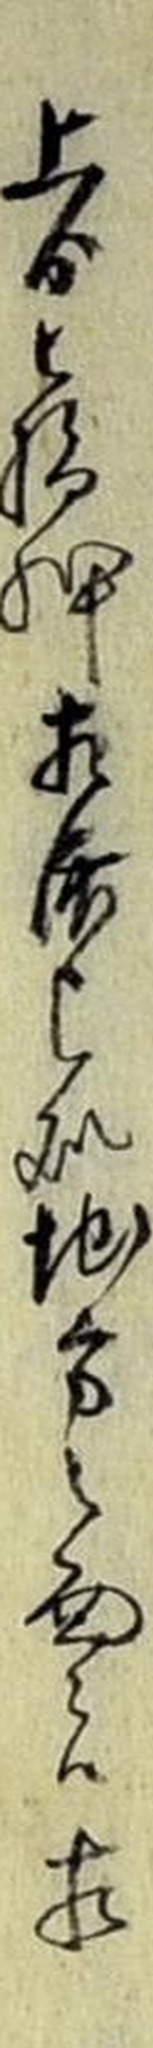上ゟ被指押相済申候処地方之面々ハ相
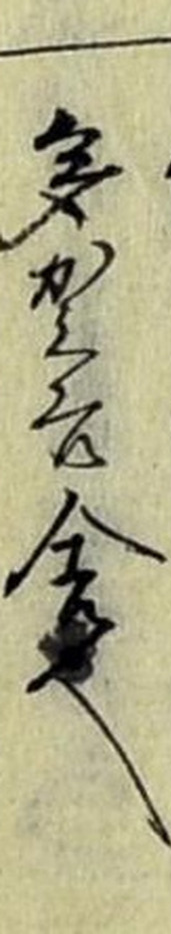多賀谷舎人
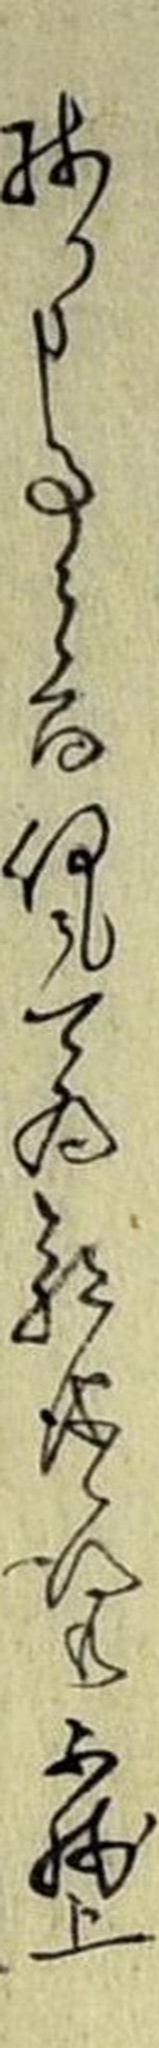残り申事ニ候間何も可為難儀候得共不残上
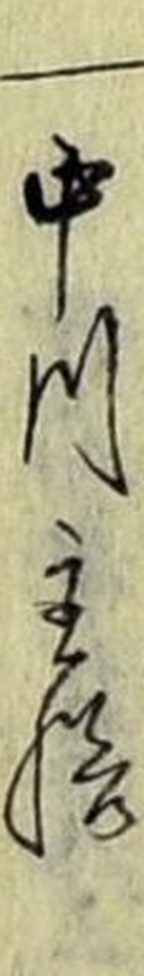中川主膳
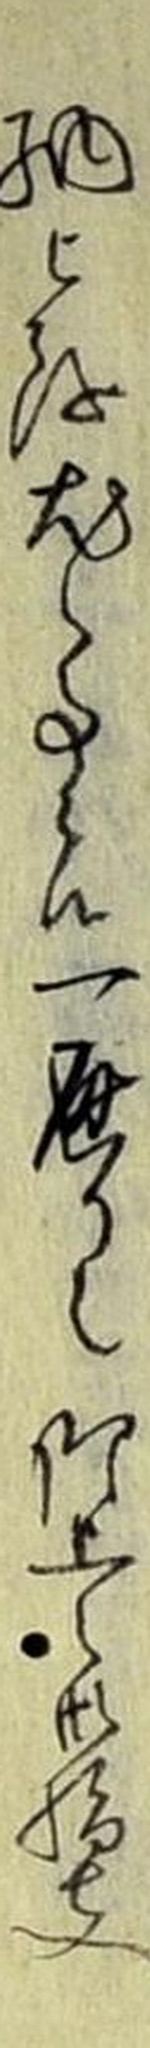納被致尤之事ニ候一通り之御上之御指支
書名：命令之部 一
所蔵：福井県文書館 Fukui Prefectural Archives
